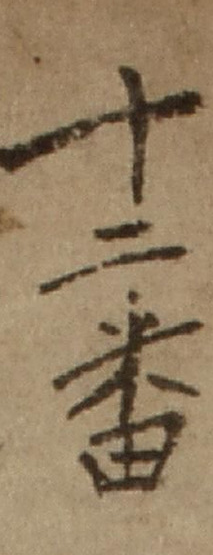十二番
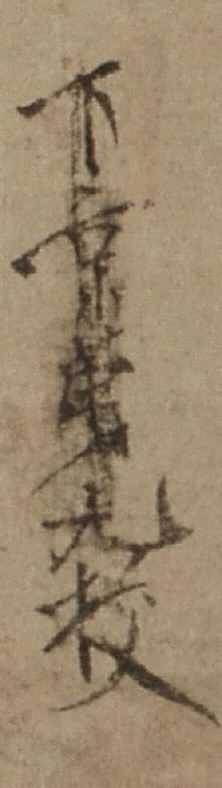下京第九校
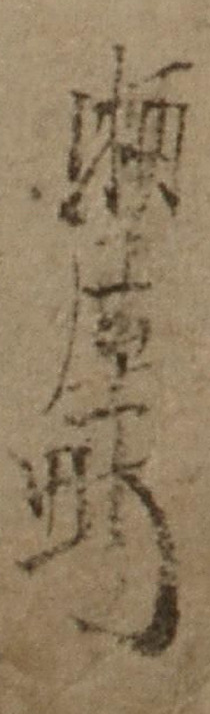瀬屋町

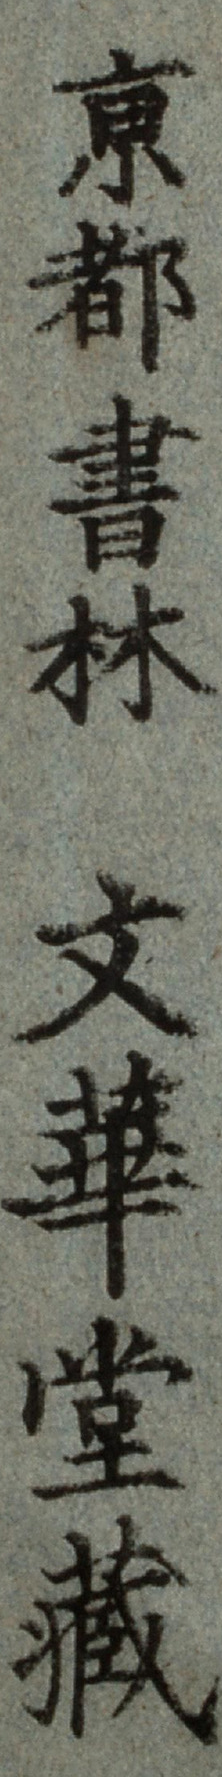京都書林文華堂蔵

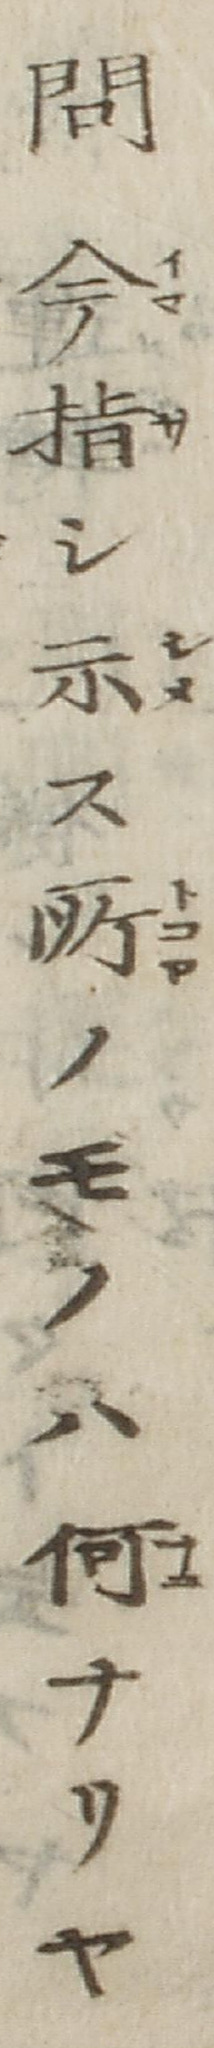問今指シ示ス所ノモノハ何ナリヤ
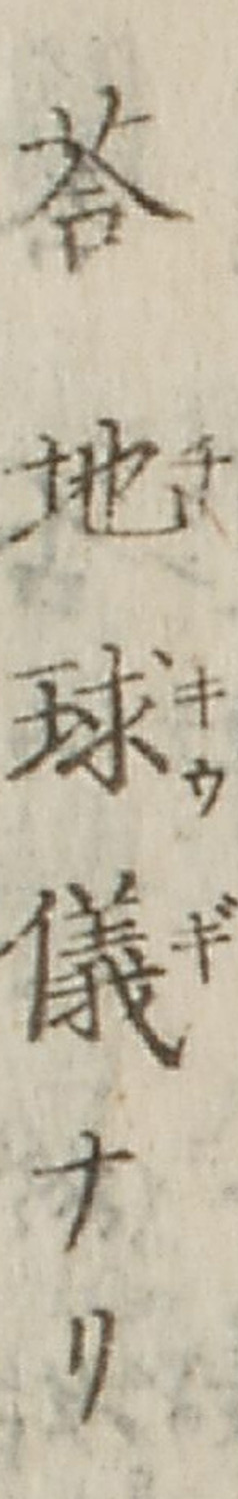答地球儀ナリ
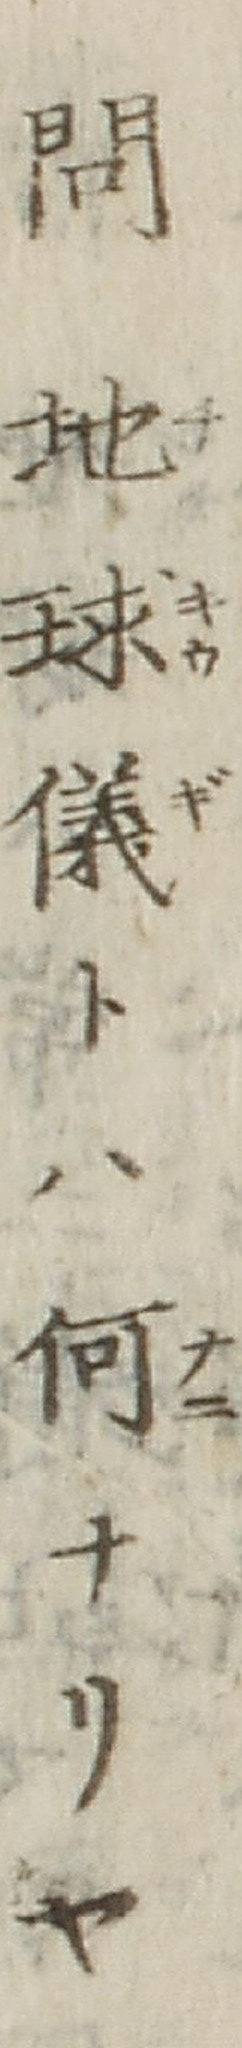問地球儀トハ何ナリヤ
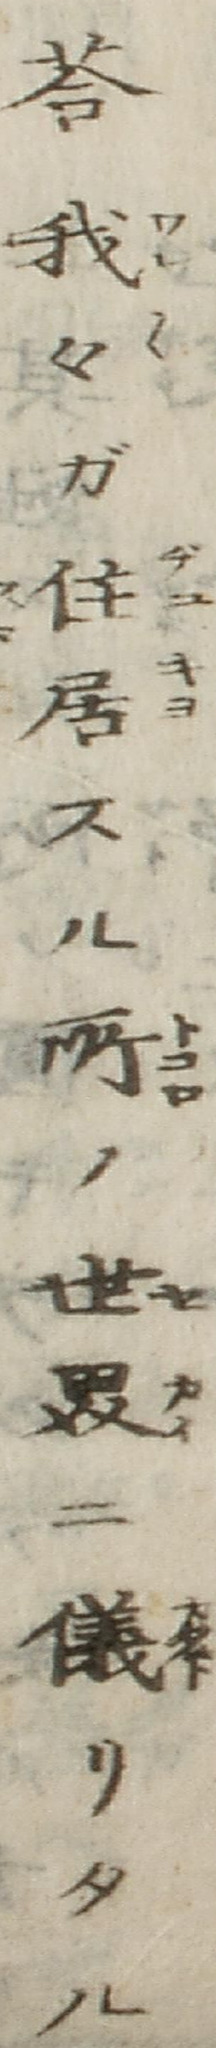答我々が住居スル所ノ世界ニ儀リタル
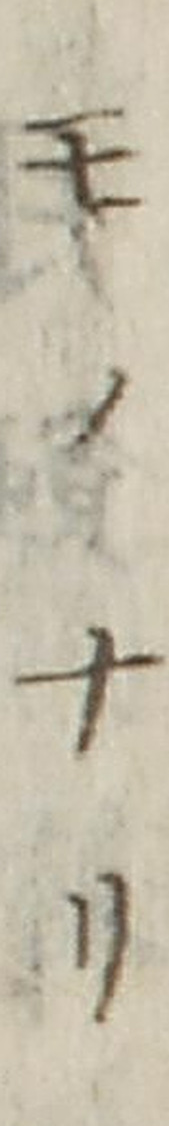モノナリ
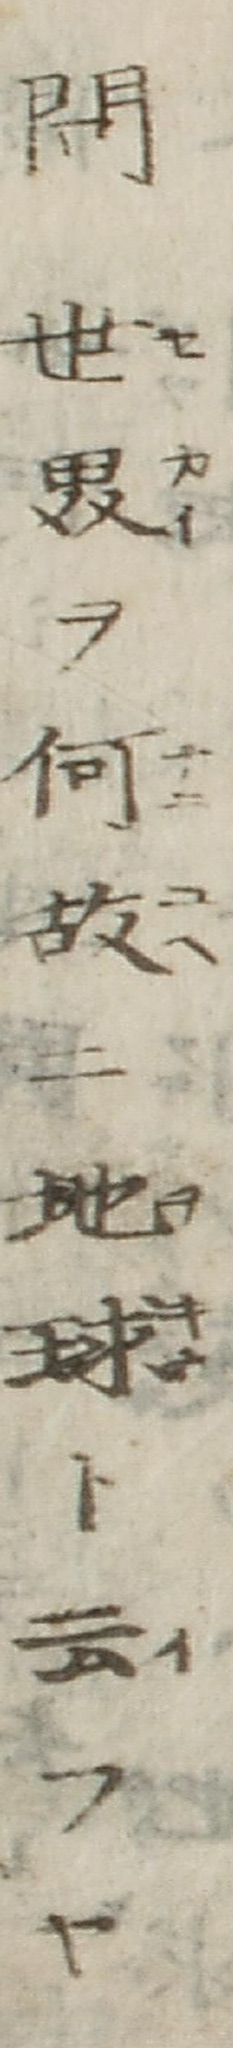問世界ヲ何故ニ地球ト云フヤ
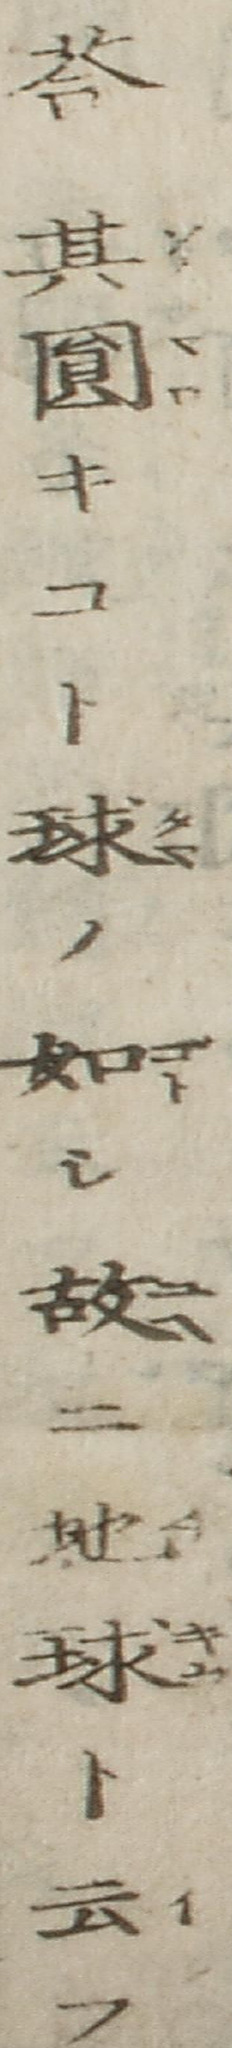答其圓キコト球ノ如シ故ニ地球ト云フ

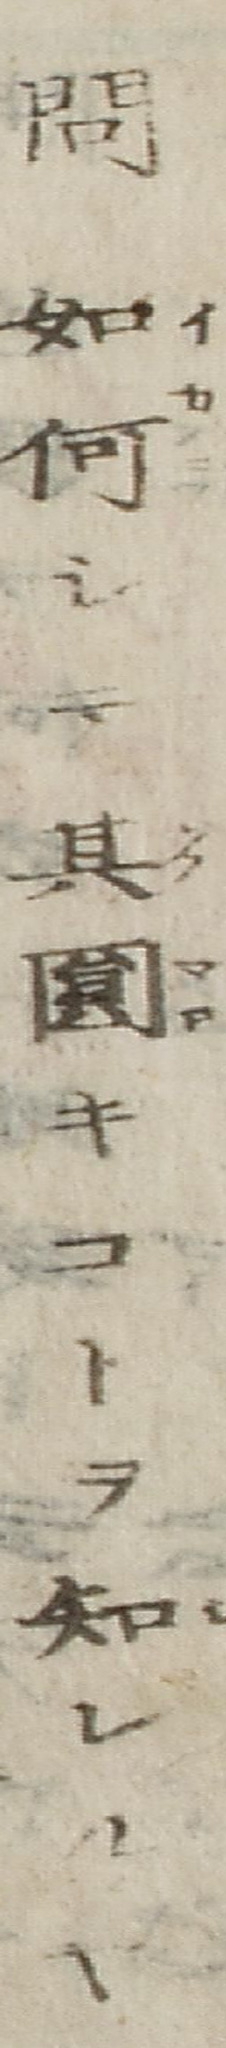問如何シテ其圓キコトヲ知レルヤ
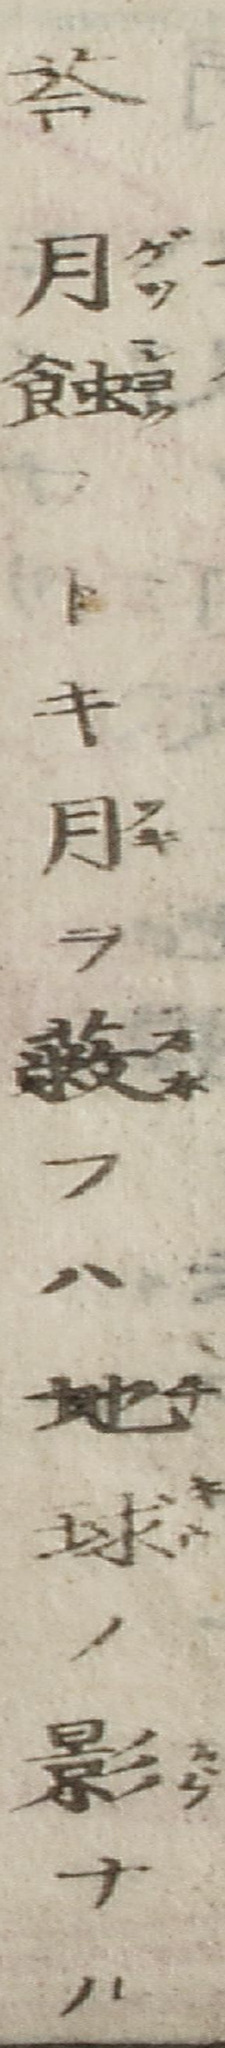答月蝕ノトキ月ヲ蔽フハ地球ノ影ナル
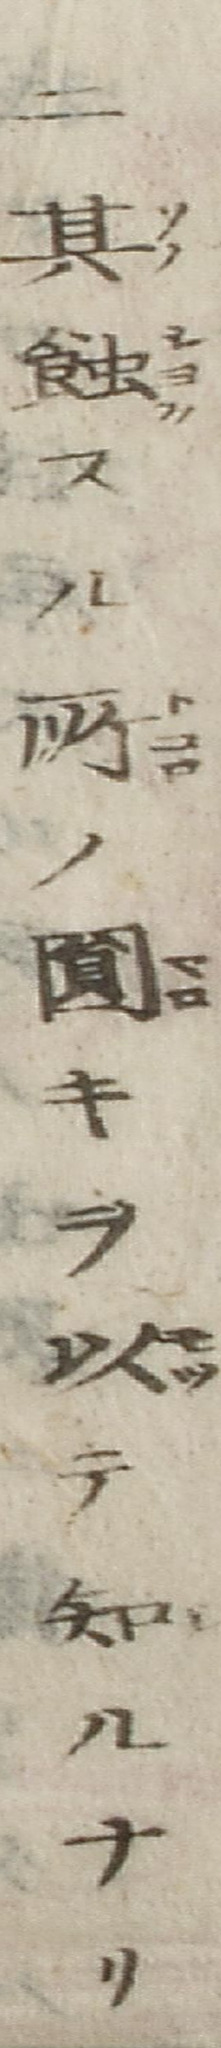ニ其蝕スル所ノ圓キヲ以テ知ルナリ
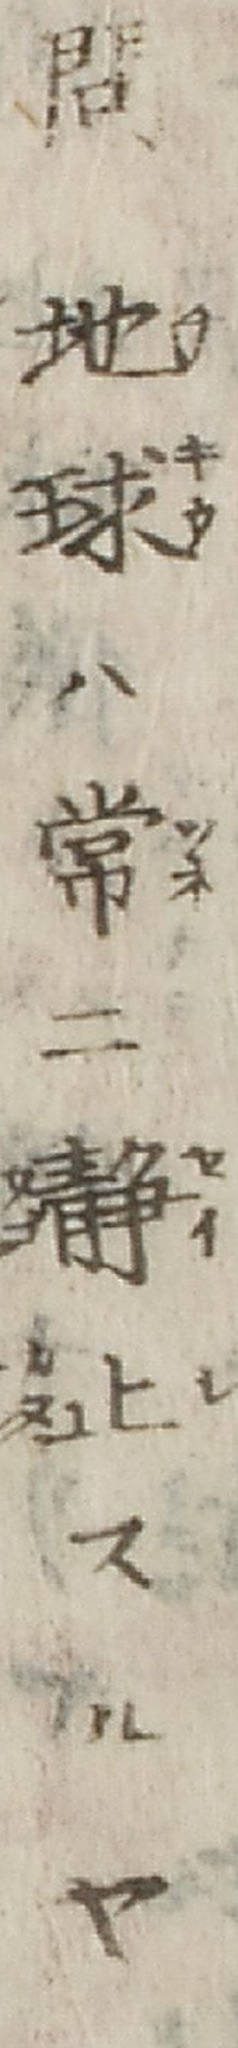問地球ハ常ニ静止スルヤ
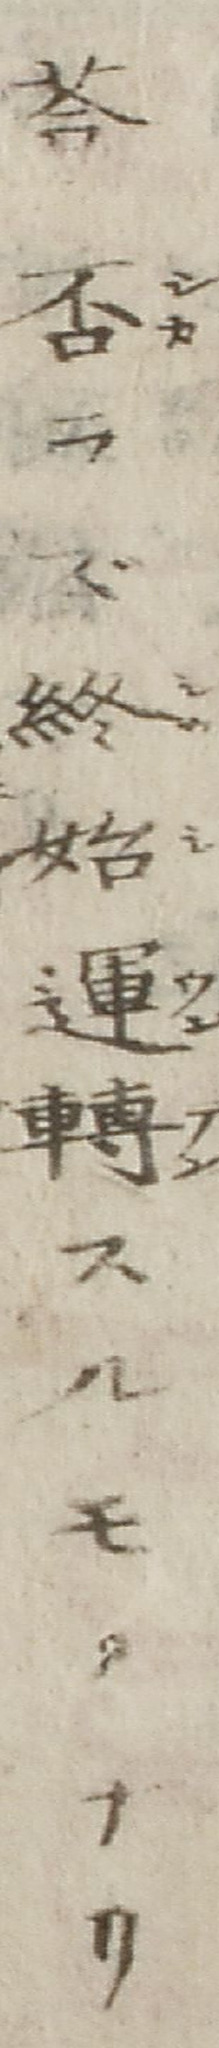答否ラズ終始運転スルモノナリ
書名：地球儀問答　全
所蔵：東京大学地震研究所図書室 Earthquake Research Institute Library, The University of Tokyo, JAPAN
